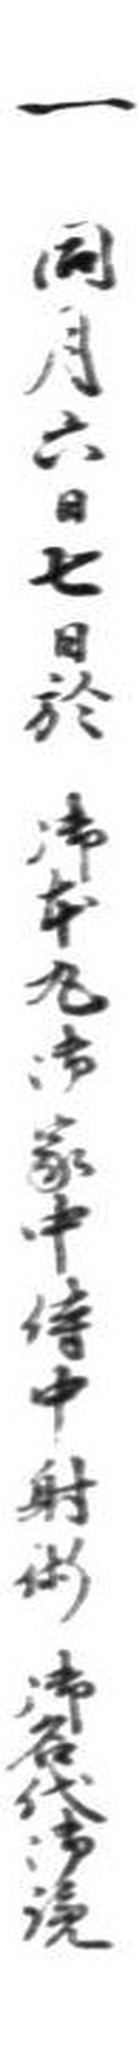一同月六日七日於御本丸御家中侍中射術御名代御覧

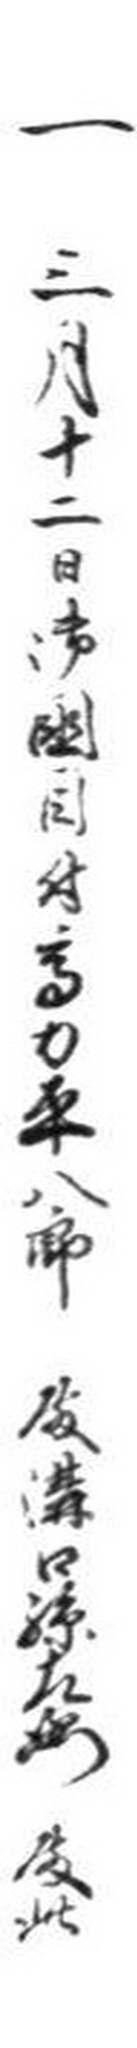一三月十二日御国目付高力平八郎殿溝口孫左衛門殿此
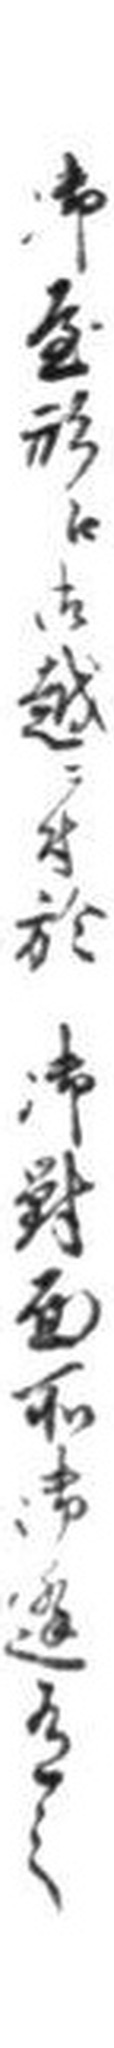御屋形江御越ニ付於御対面所御逢有之
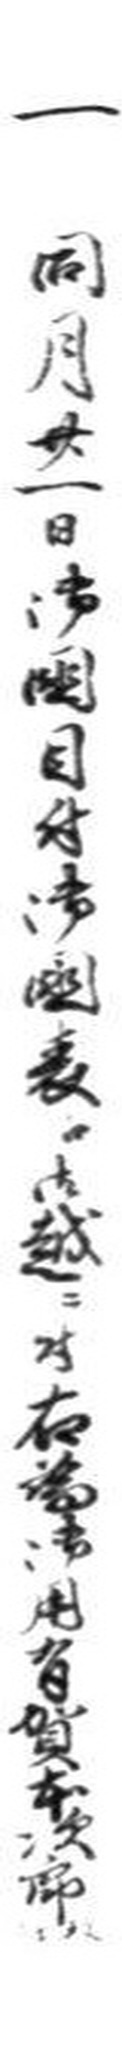一同月廿一日御国目付御国表江御越ニ付右為御用有賀本次郎政逢
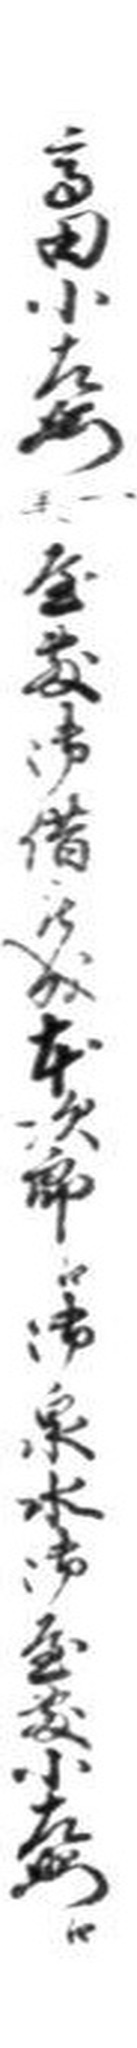高田小左衛門一屋敷御借被成本次郎江御泉水御屋敷小左衛門江
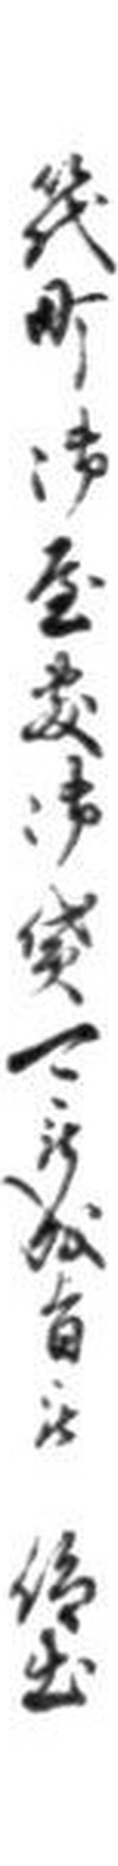筏町御屋敷御貸可被成旨被仰出
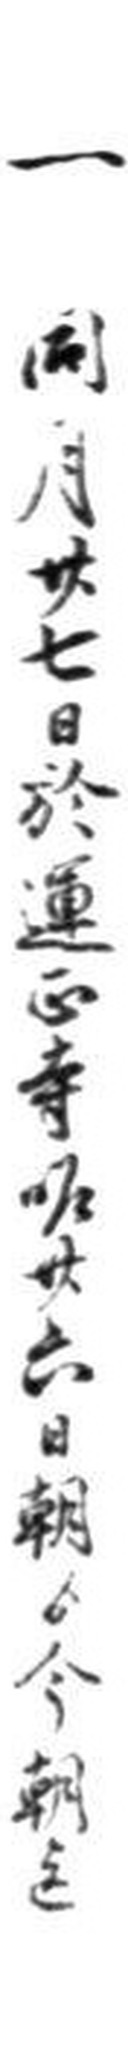一同月廿七日於運正寺昨廿六日朝ゟ今朝迄
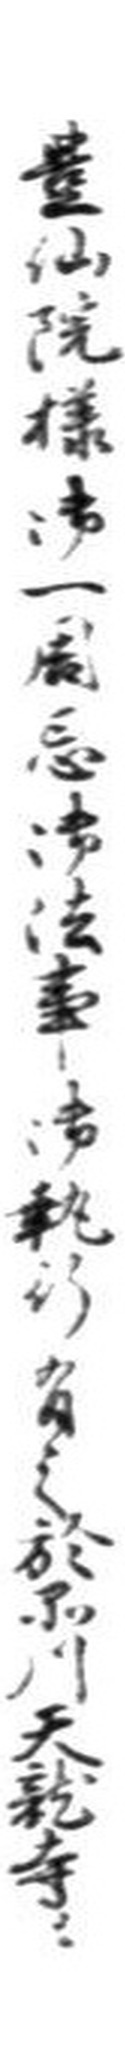豊仙院様御一周忌御法事御執行有之於品川天龍寺も
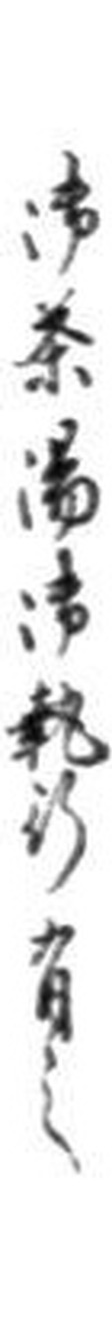御茶湯御執行有之
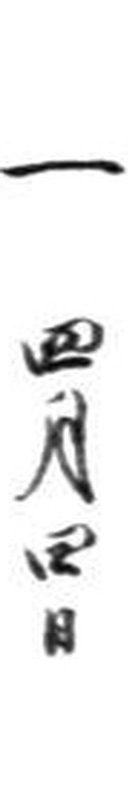一四月四日
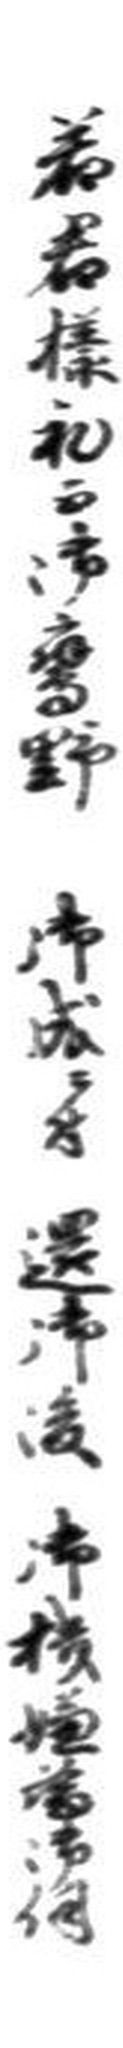若君様初而御鷹野御成ニ付還御後御機嫌為御伺
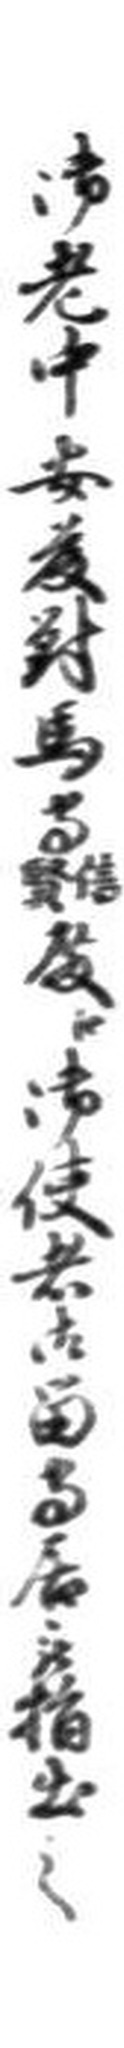御老中安藤対馬守信賢殿江御使者御留守居被指出之
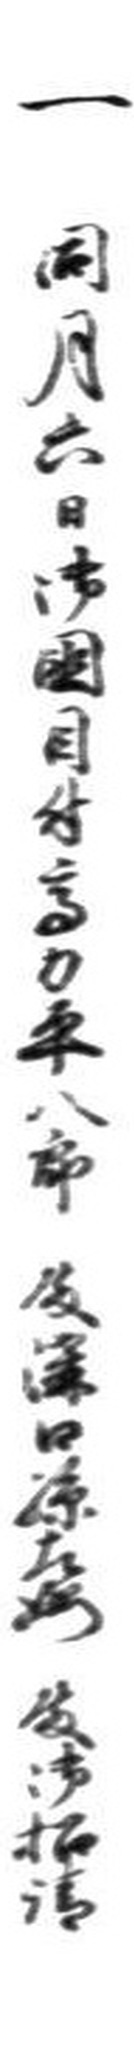一同月六日御国目付高力平八郎殿溝口孫左衛門殿御招請
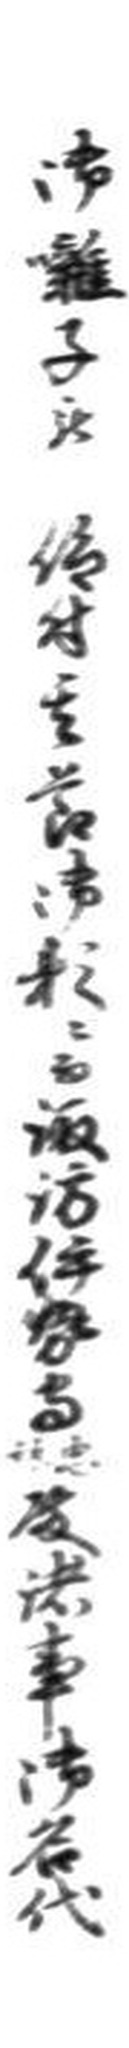御囃子被仰付其節御頼ニ而諏訪伊勢守忠林殿諸事御名代
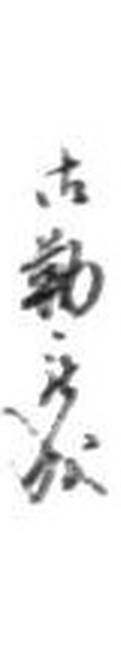御勤被成
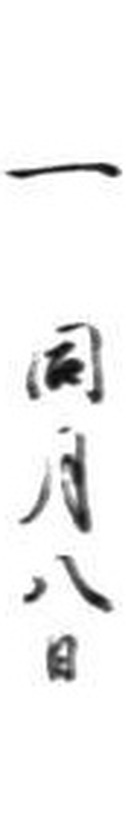一同月八日
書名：家譜 三十九 宗矩公 享保十年
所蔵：福井県文書館 Fukui Prefectural Archives
